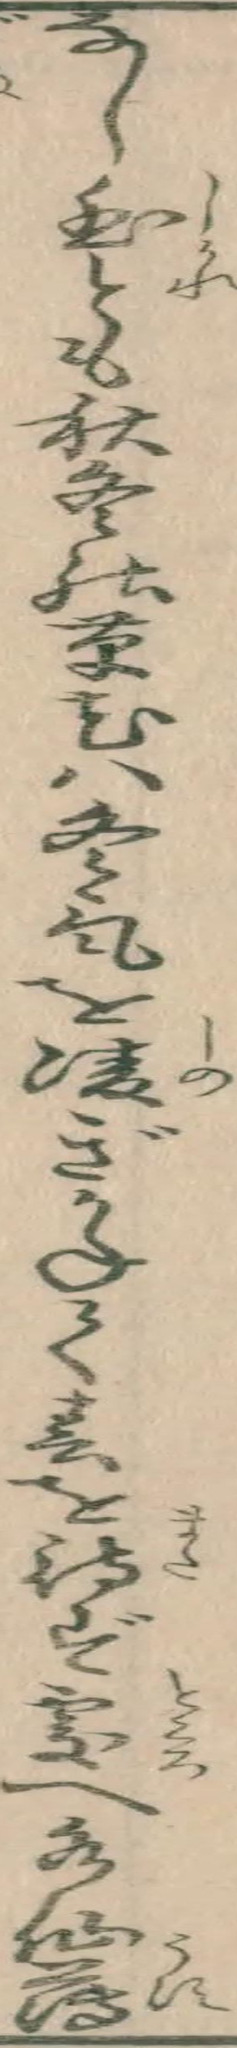なし然とも秋冬の草花は冬気を凌ぎかねて春を待ず処へ水仙薄
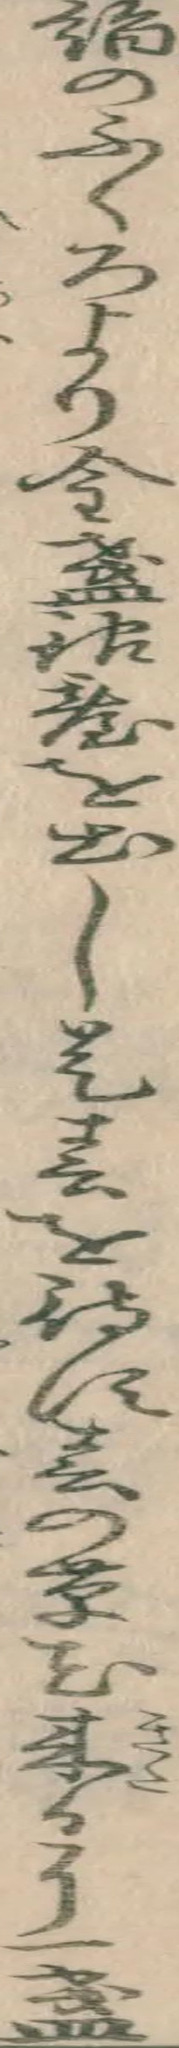絹のふくろより金盞銀台を出し是春を待す春の草花来るに一盞
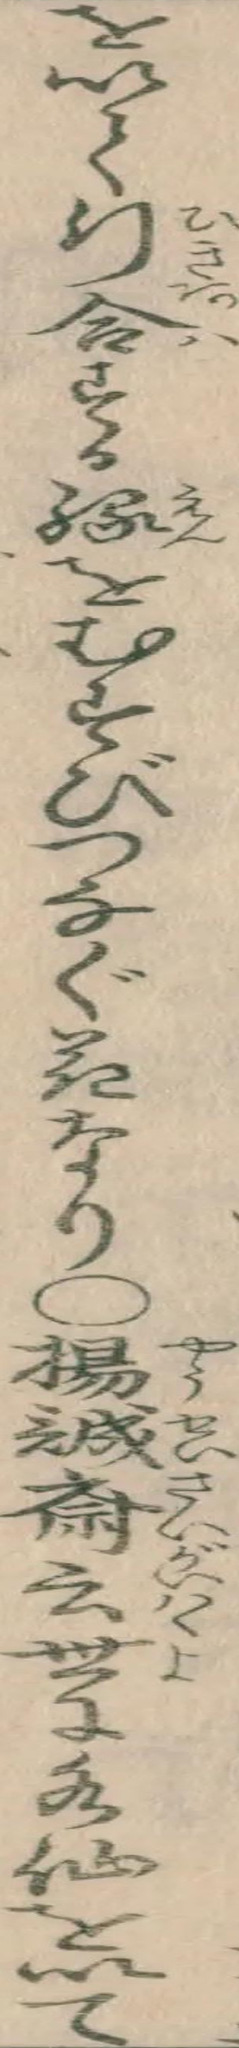を以て引合する縁をむすびつなぐ花なり○楊誠斎云世に水仙を以て
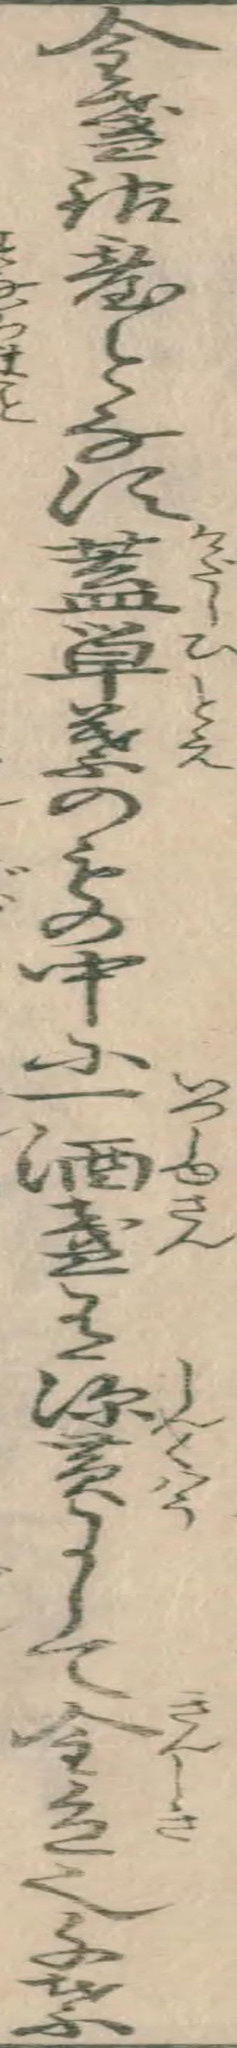金盞銀台となす蓋単葉のもの中に一酒盞有深黄にして金色也千葉
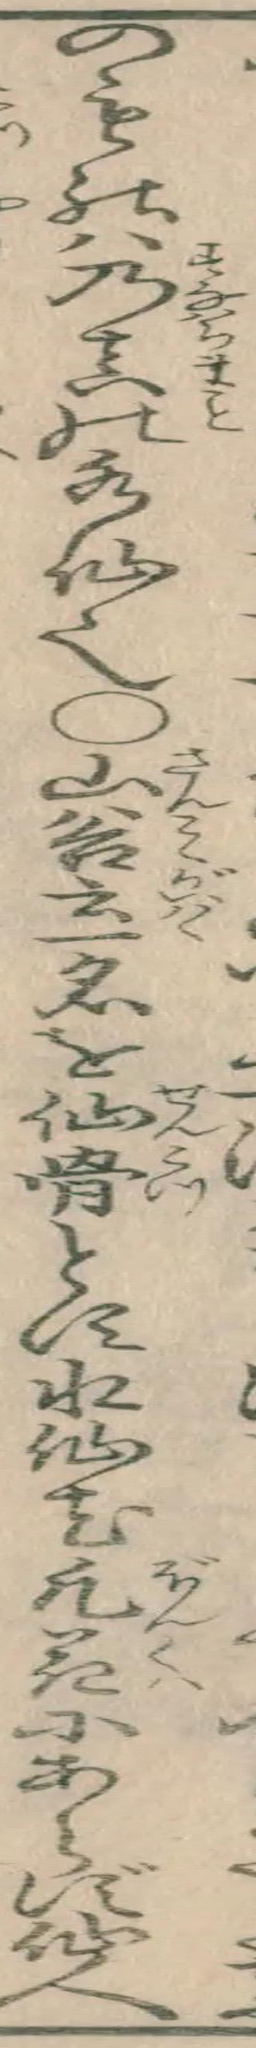のものは乃真の水仙也○山谷云一名を仙骨とす水仙花凡花にあらず仙人
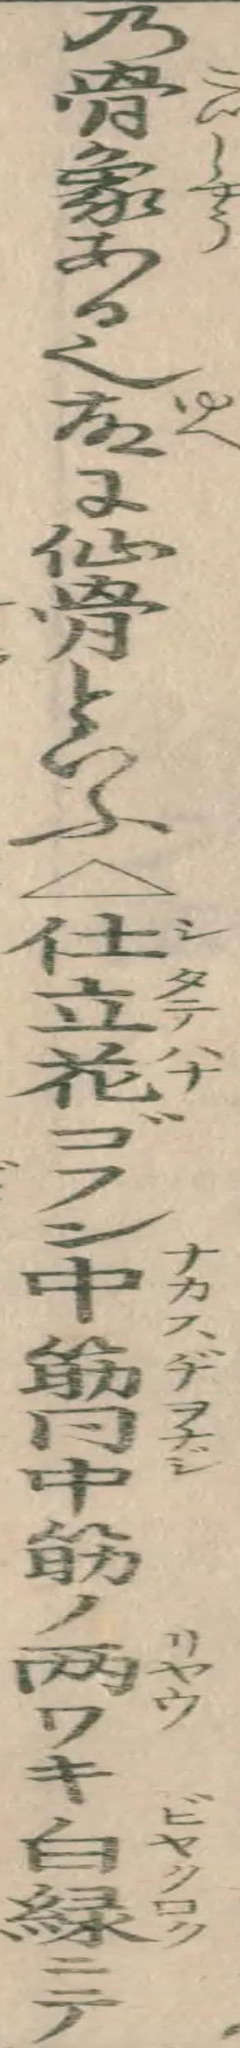の骨象ある也故に仙骨といふ△仕立花ゴフン中筋同中筋ノ両ワキ白緑ニテ
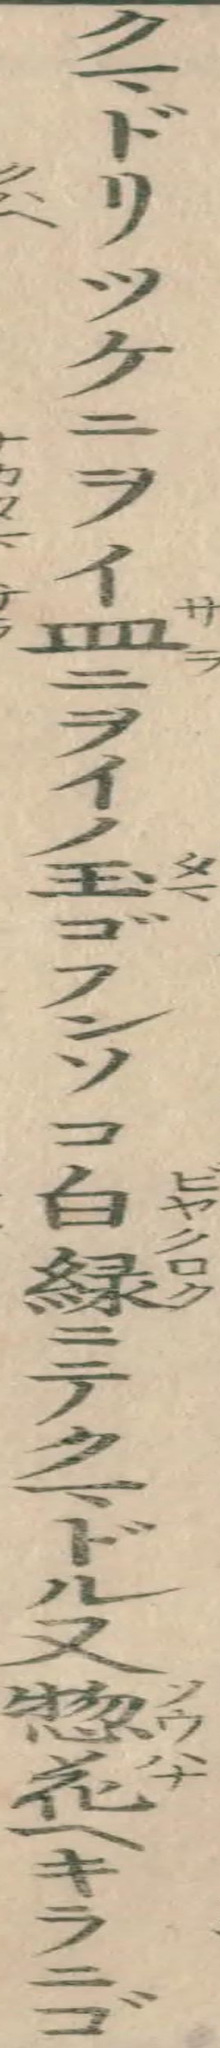クマドリツケニヲイ皿ニヲイノ玉ゴフンソコ白緑ニテクマドル又総花ヘキラニゴ
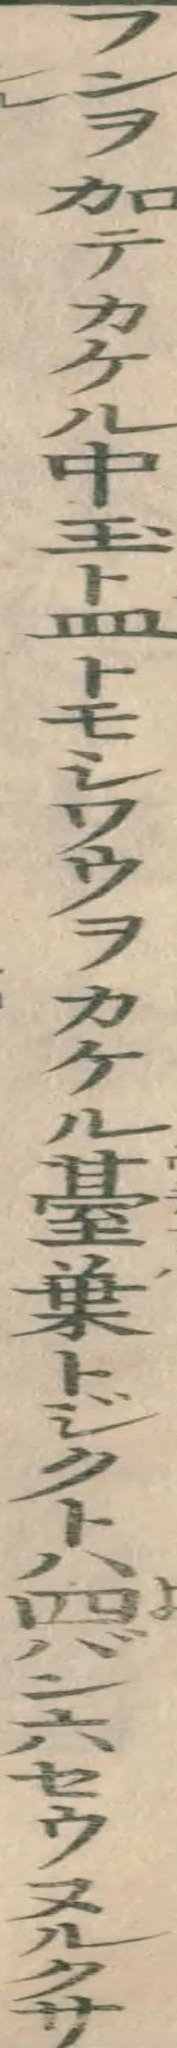フンヲ加テカケル中玉ト皿トモシワウヲカケル台葉トジクトハ四バン六セウヌルクサ
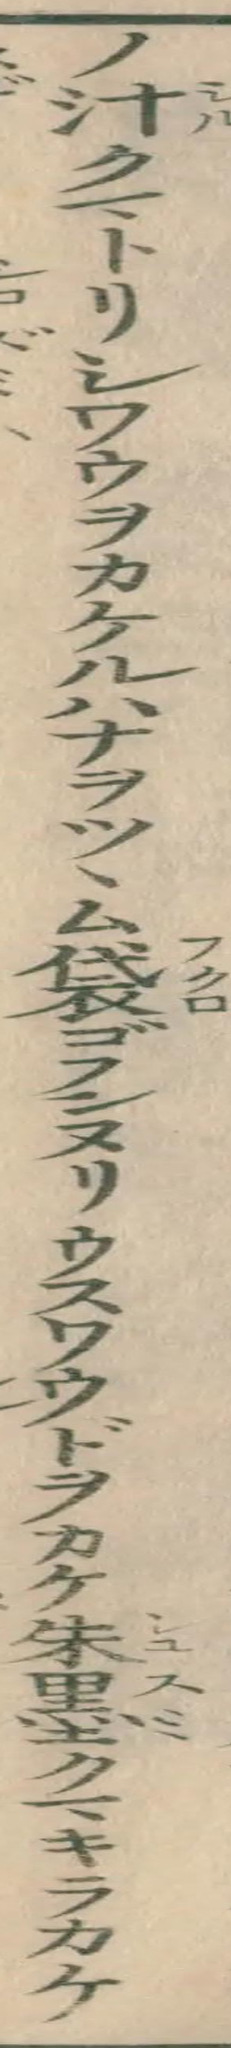ノ汁クマトリシワウヲカケルハナヲツヽム袋ゴフンヌリウスワウドヲカケ朱墨クマキラカケ
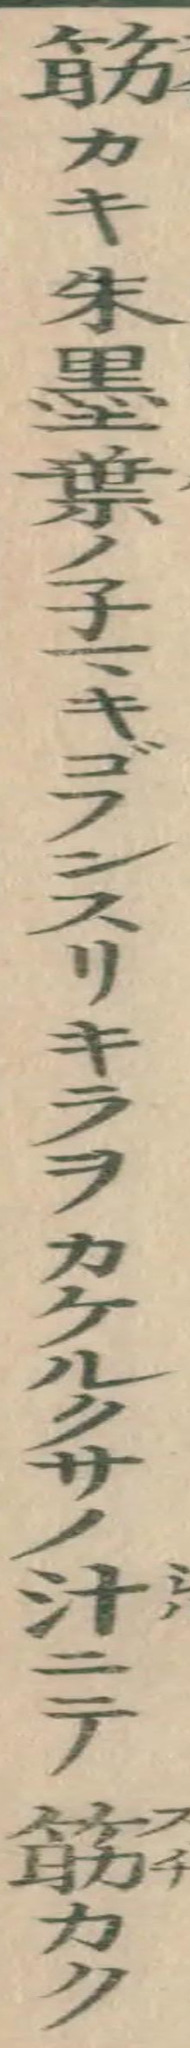筋カキ朱墨葉ノネマキゴフンスリキラヲカケルクサノ汁ニテ筋カク

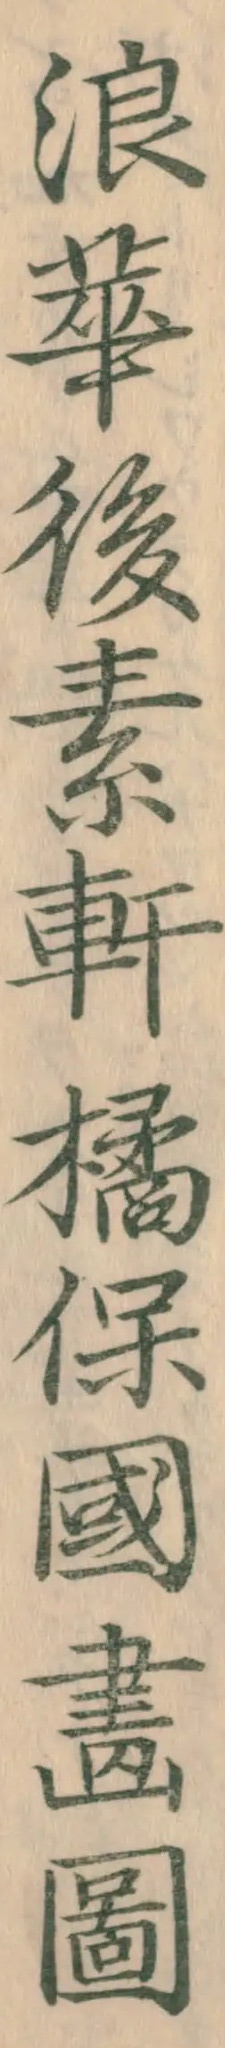浪華後素軒橘保国画図
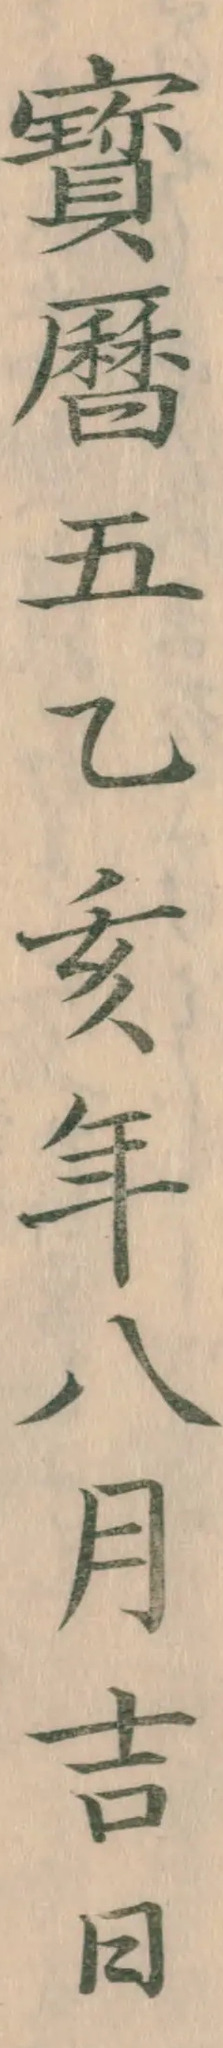宝暦五乙亥年八月吉日
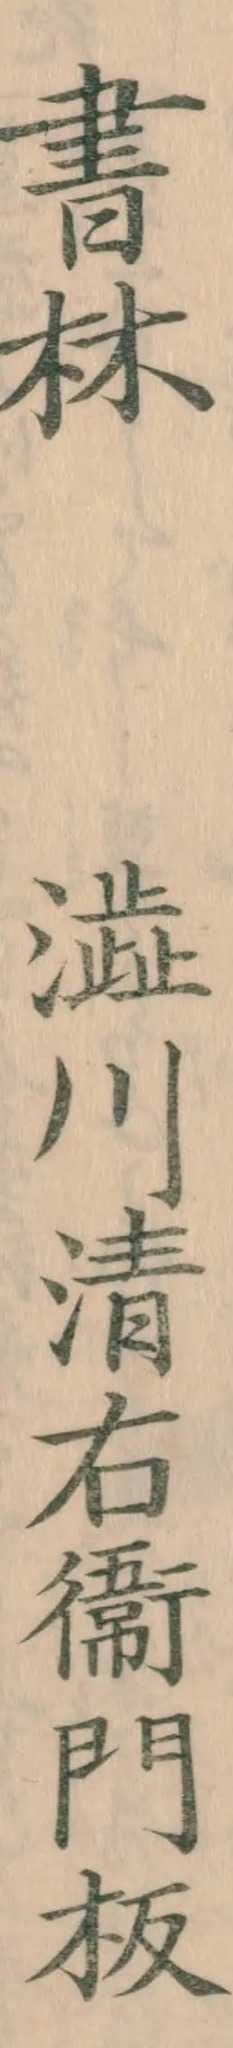書林渋川清右衛門板
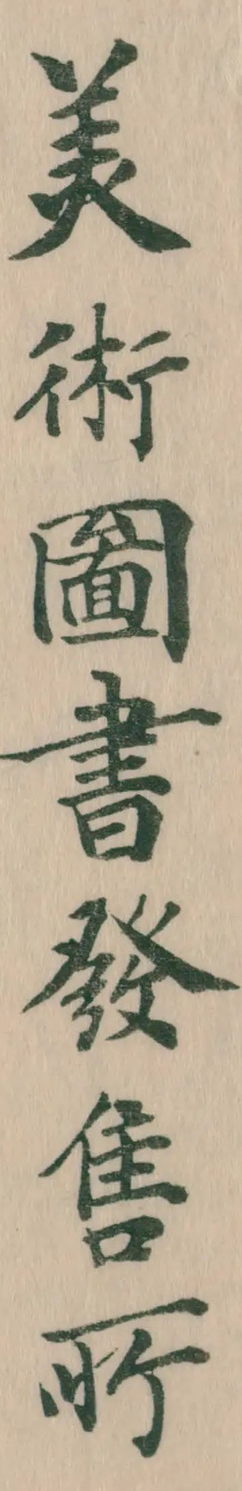美術図書発售所
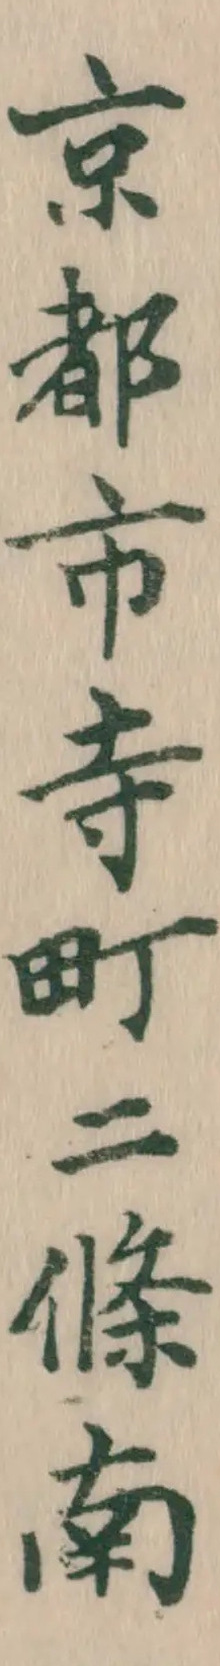京都市寺町二条南
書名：畫本野山草. [5]
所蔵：国立国会図書館 National Diet Library, JAPAN
